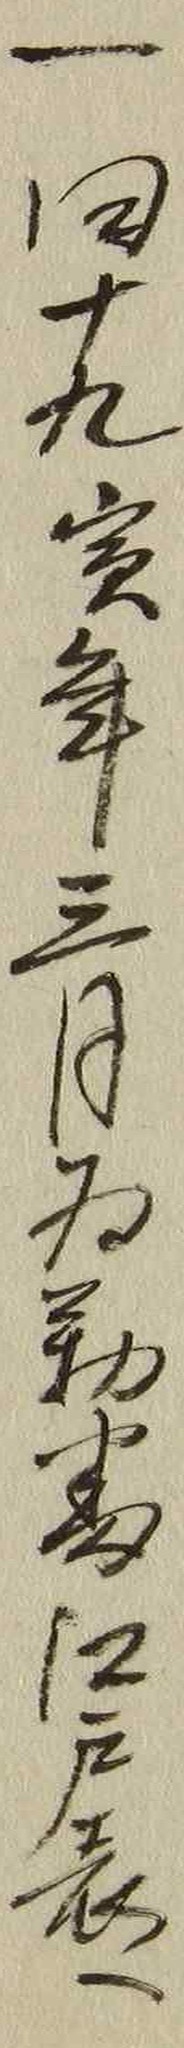一同十九寅年三月為勤番江戸表へ
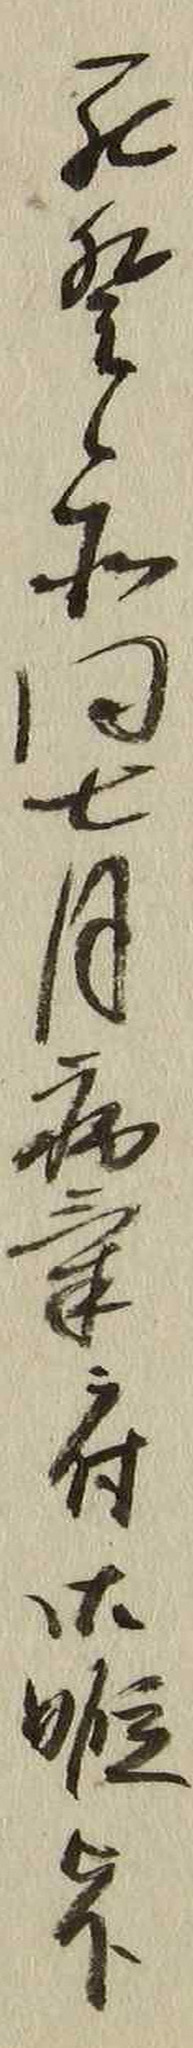罷登候所同七月病気ニ付御暇被下
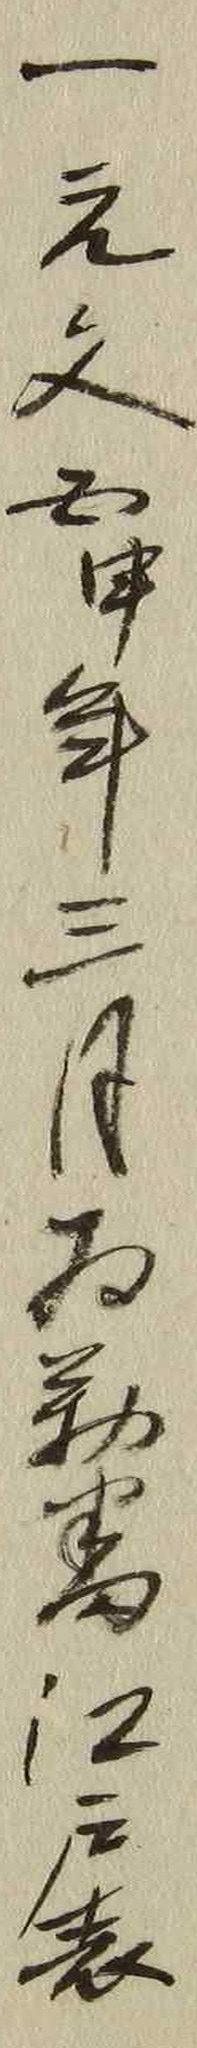一元文五申年三月為勤番江戸表
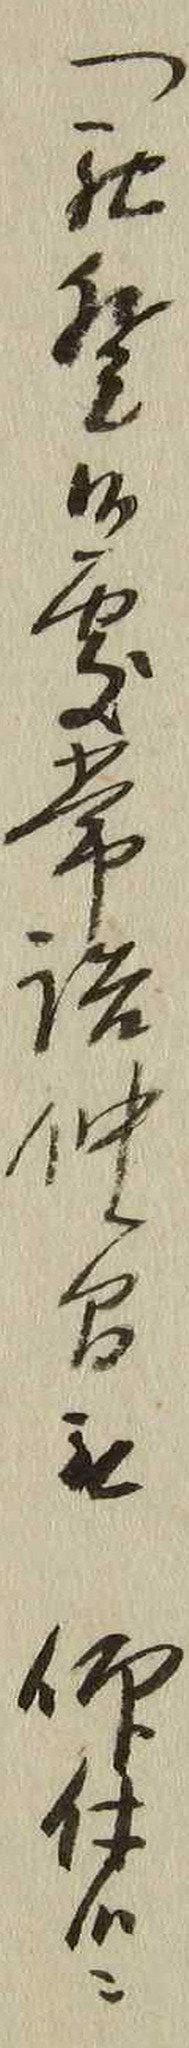へ罷登候処常詰仲ケ間被仰付候ニ
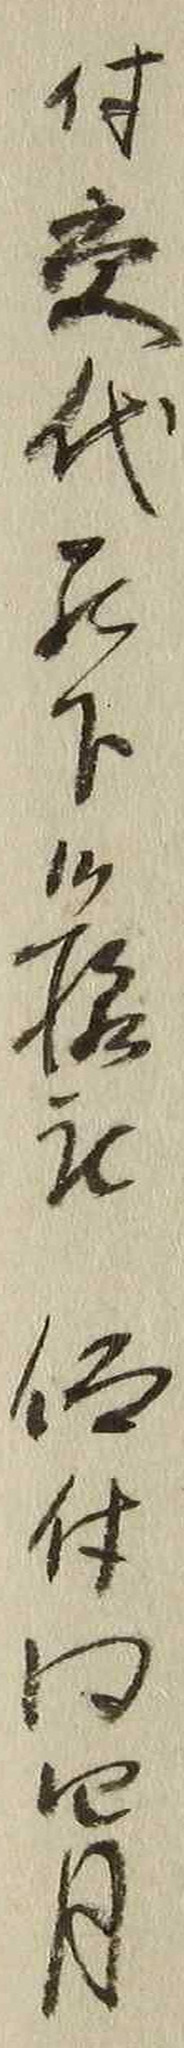付交代罷下候様被仰付同四月
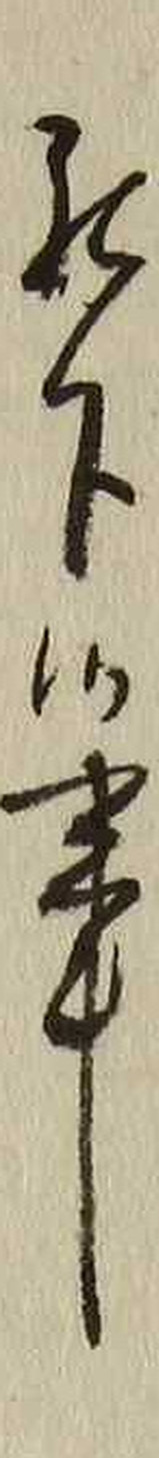罷下候事
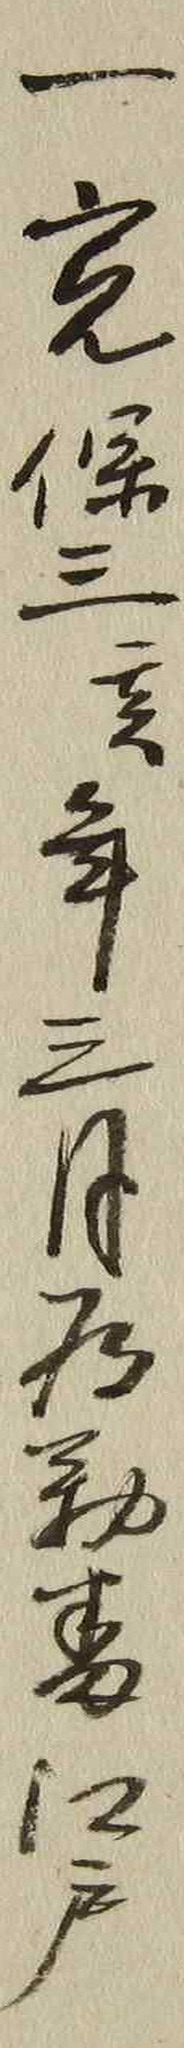一寛保三亥年三月為勤番江戸
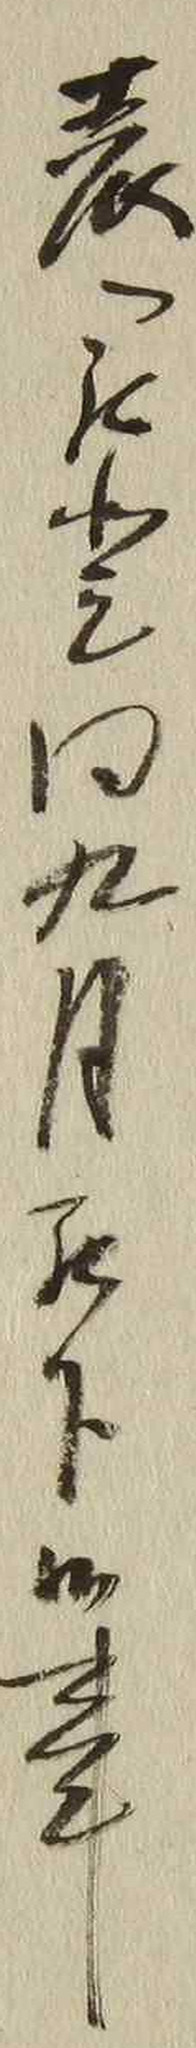表へ罷登同九月罷下候事
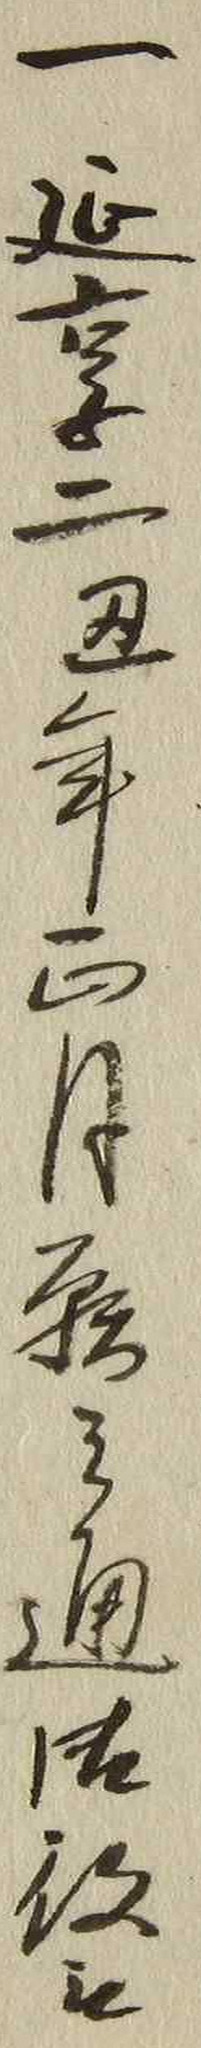一延享二丑正月願之通御役被
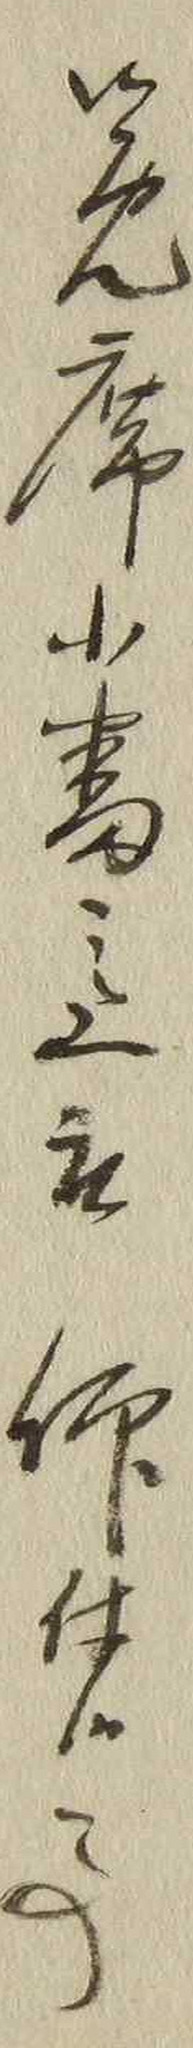御免席小番之上被仰付候事
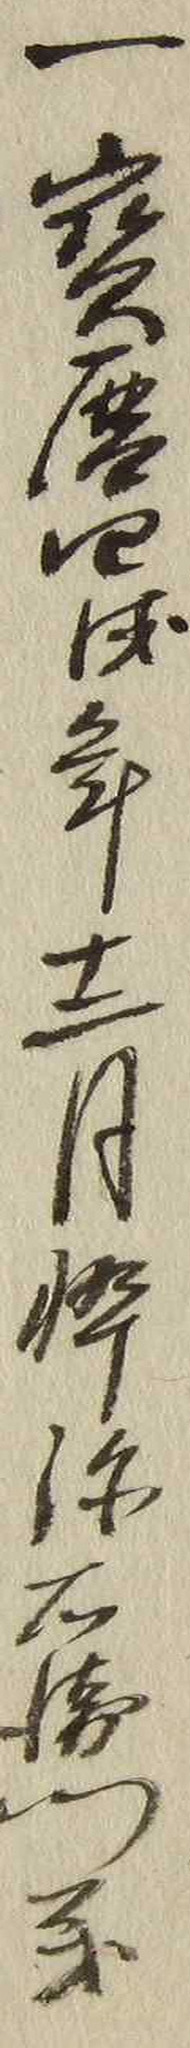一宝暦四戊年十二月忰弥右衛門義
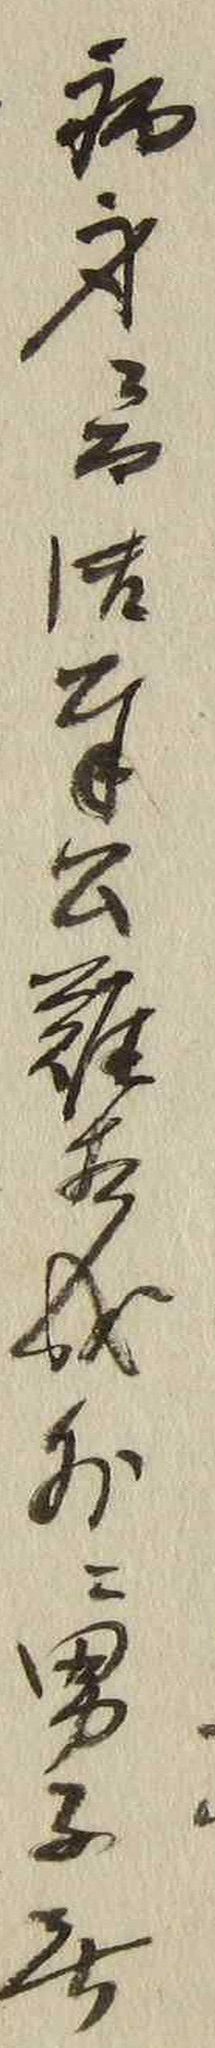病身ニ而御奉公難相成外ニ男子無
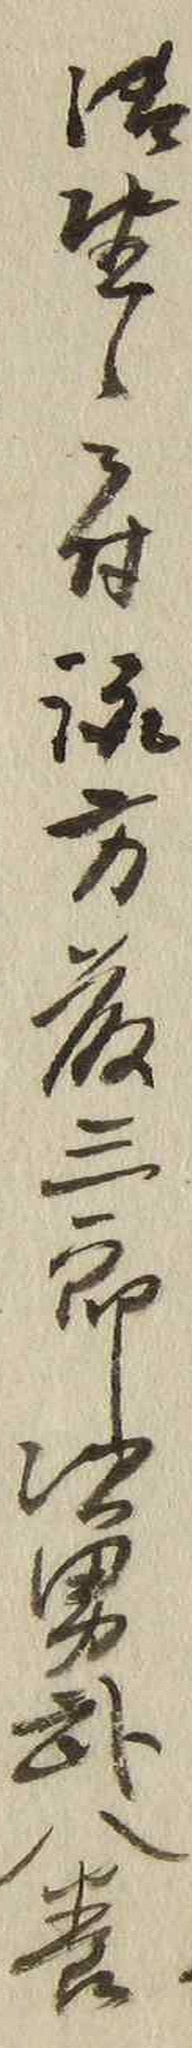御坐候ニ付諏方藤三郎次男武八養
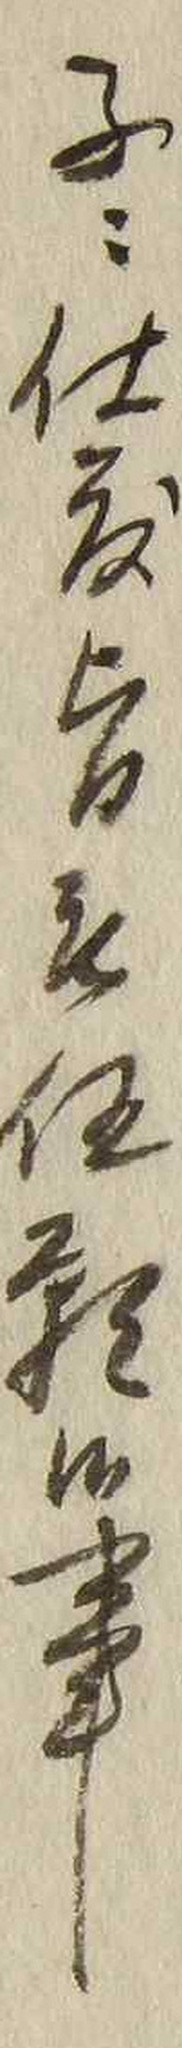子ニ仕度旨被任願候事
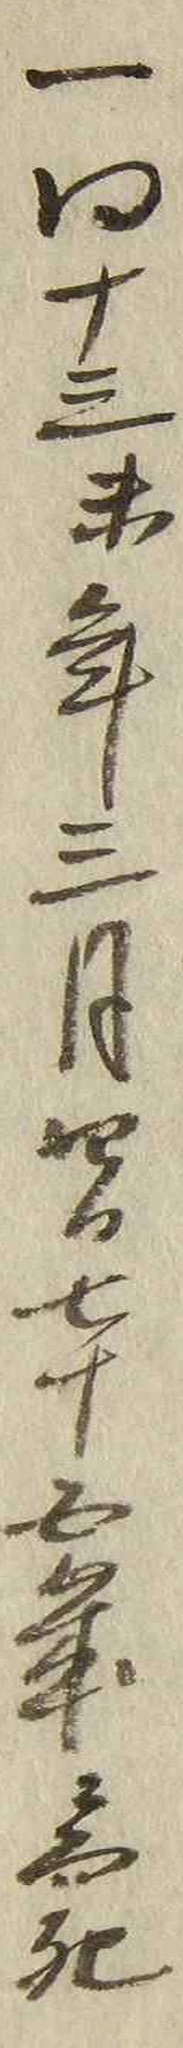一同十三未年三月四日七十五歳ニ而死

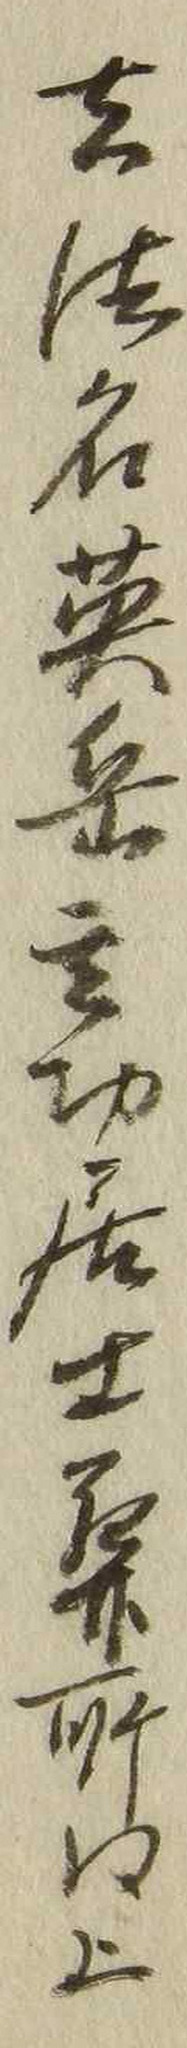去法名英岳玄功居士葬所同上
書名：諸士系譜　巻之359　す之部9
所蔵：会津若松市立会津図書館
